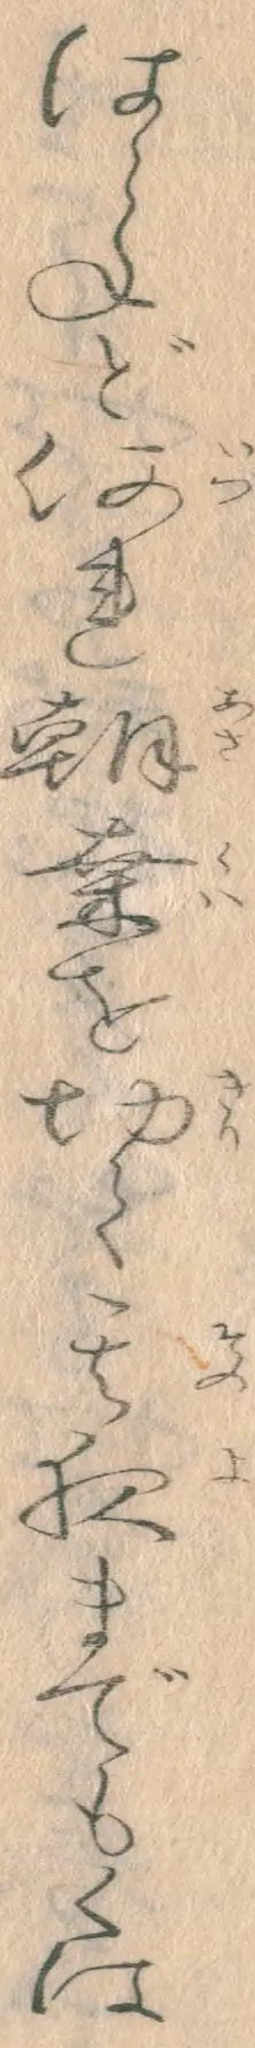はらねど何れ朝桑を切て其夜までもくは
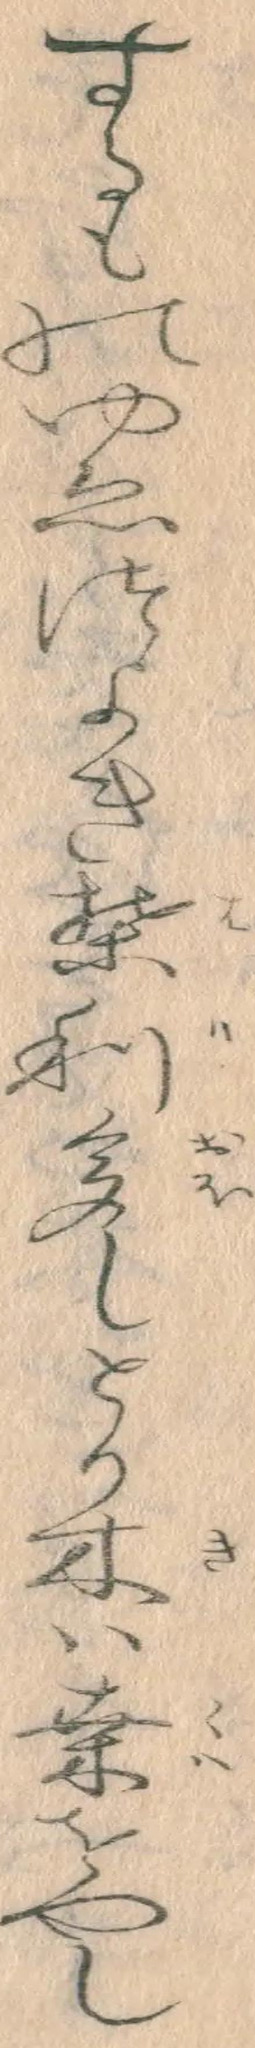するものゆゑつよき葉利多しとり木は桑をやし
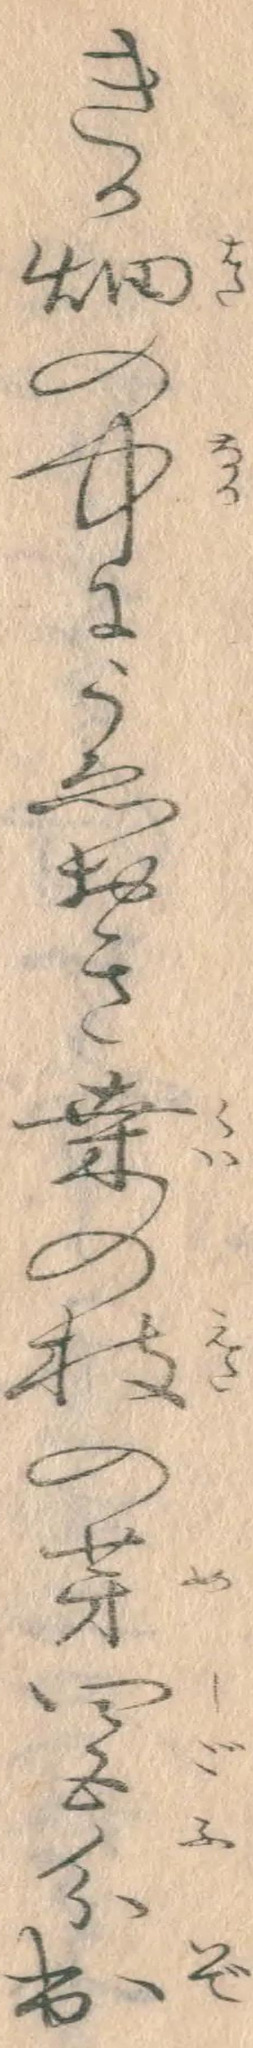きか畑の中にうゑおき桑の枝の芽四五分出
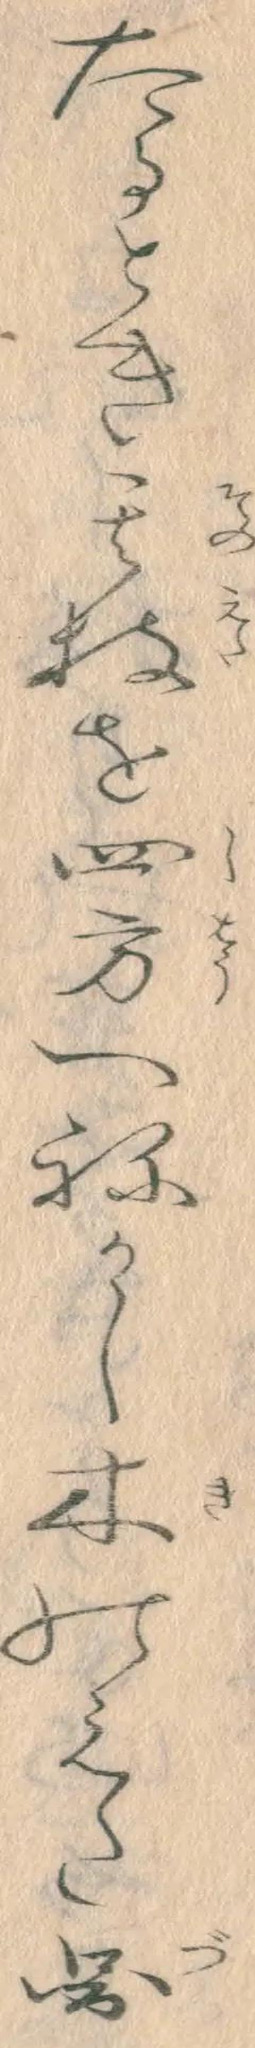たるとき其枝を四方へねかし木のえた図
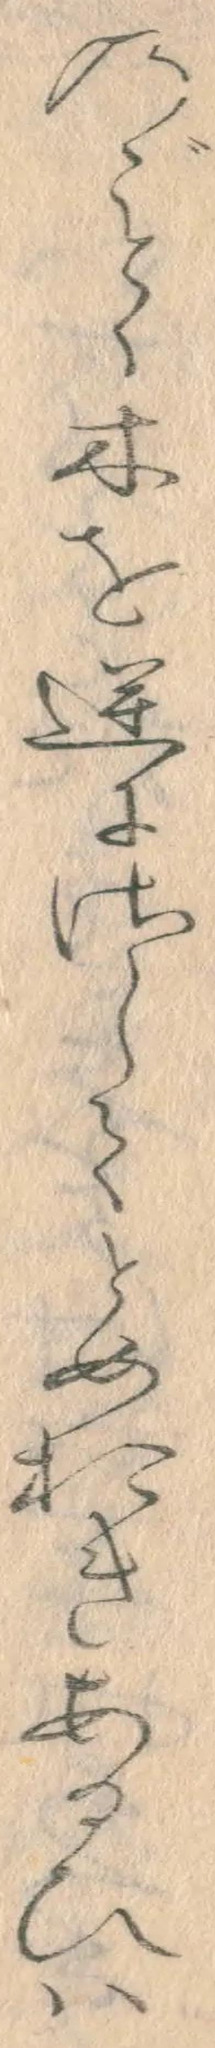のごとく木を逆にさしてとめおきあるひは
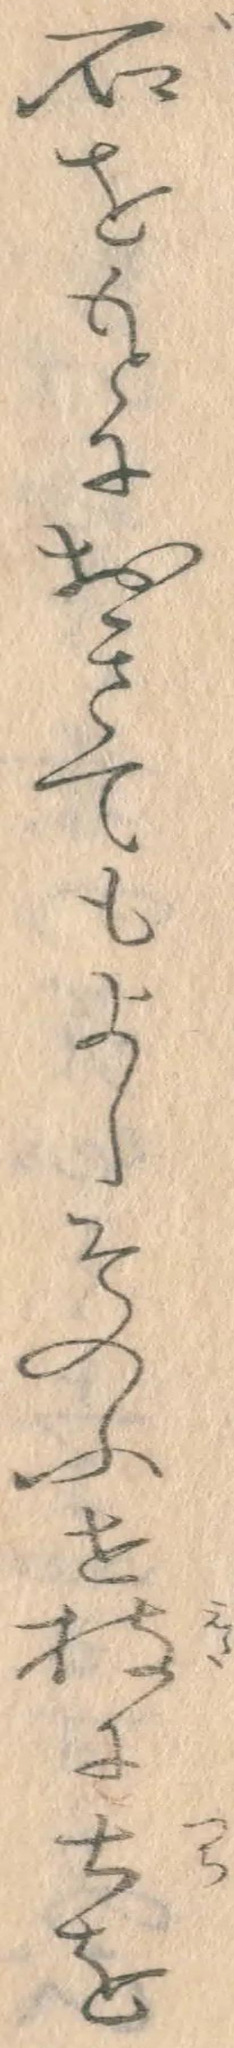石をもとにおきてもよしそのふせ枝に土を

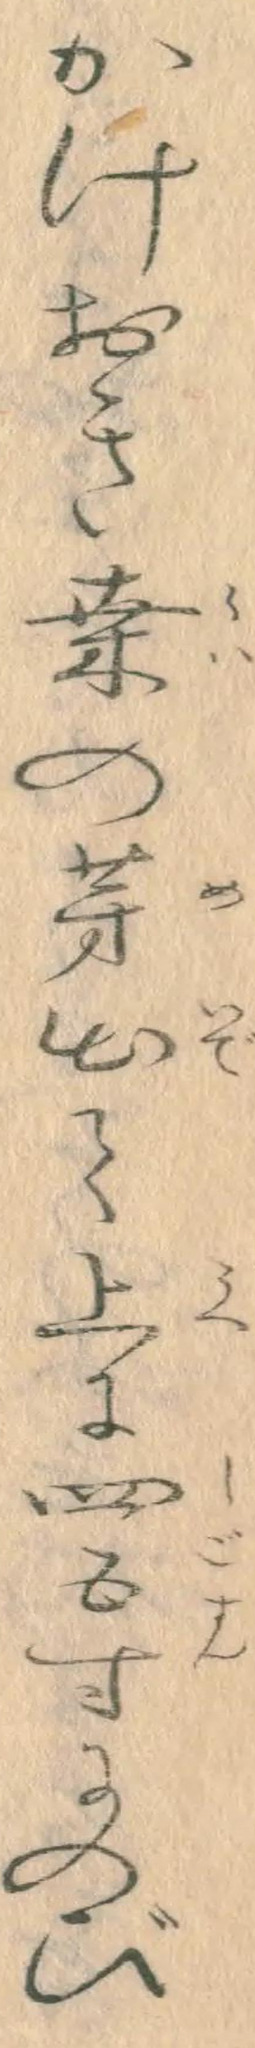かけおき桑の芽出て上に四五寸にのび
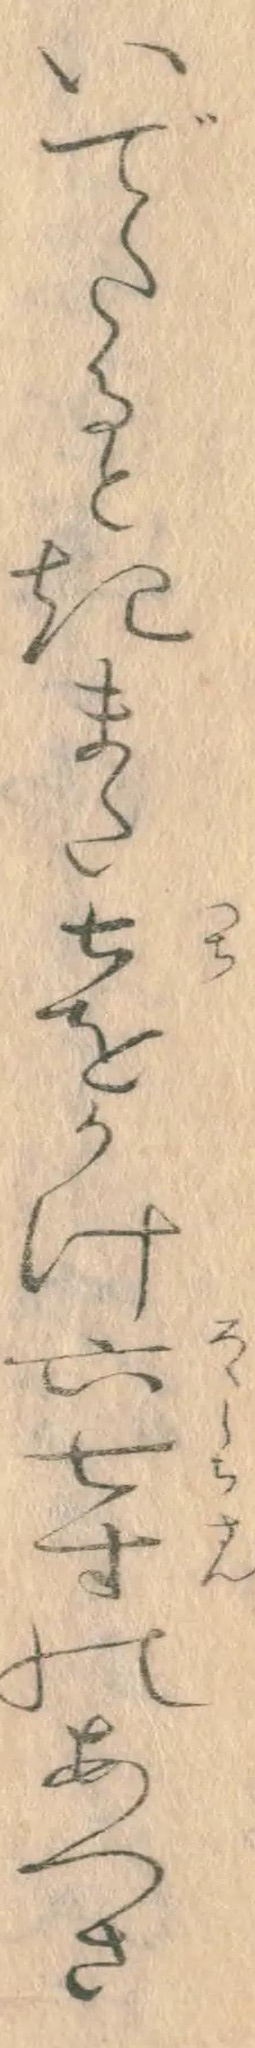いでたるときまた土をかけ六七寸のあつさ
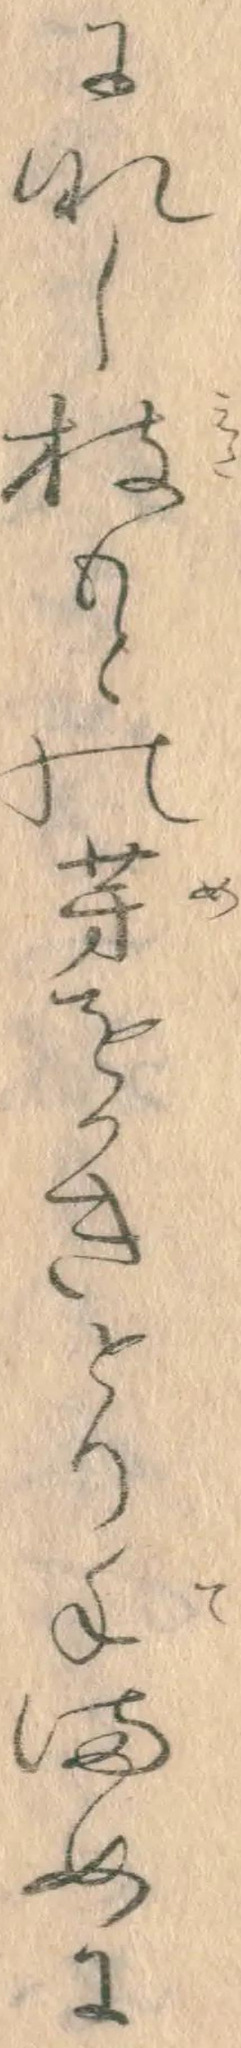になし枝もとの芽をかきとり手まめに
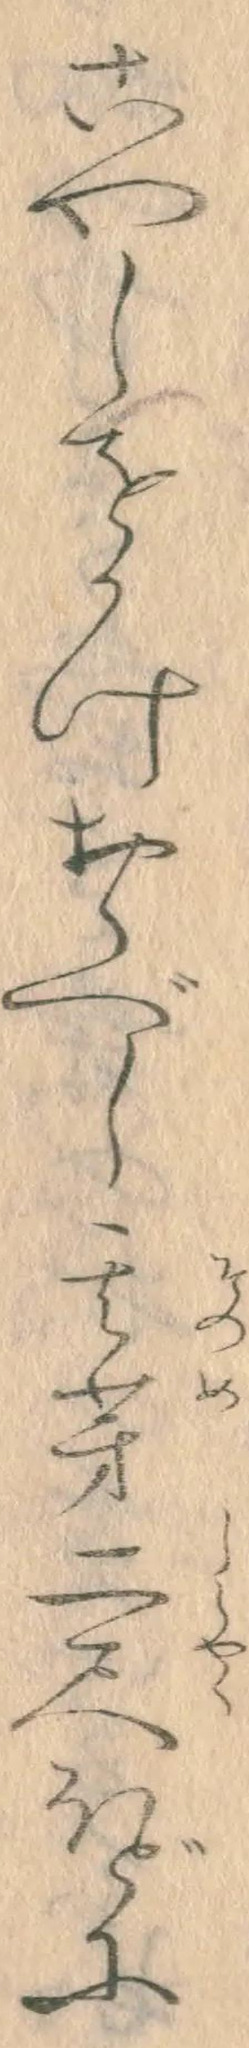こやしをかけおくべし其芽二尺ほどに
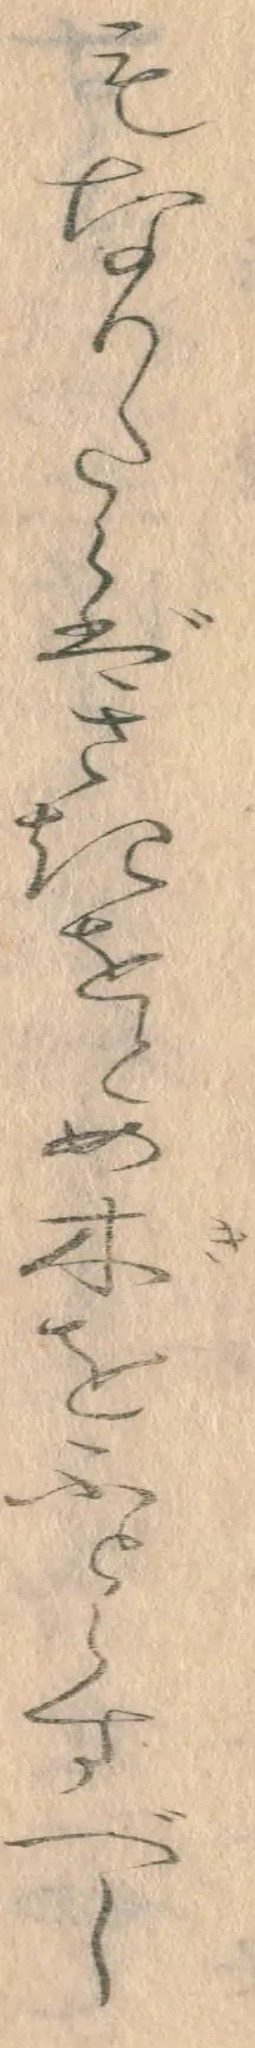もなりたらばさきをとめ木をふとらすべし
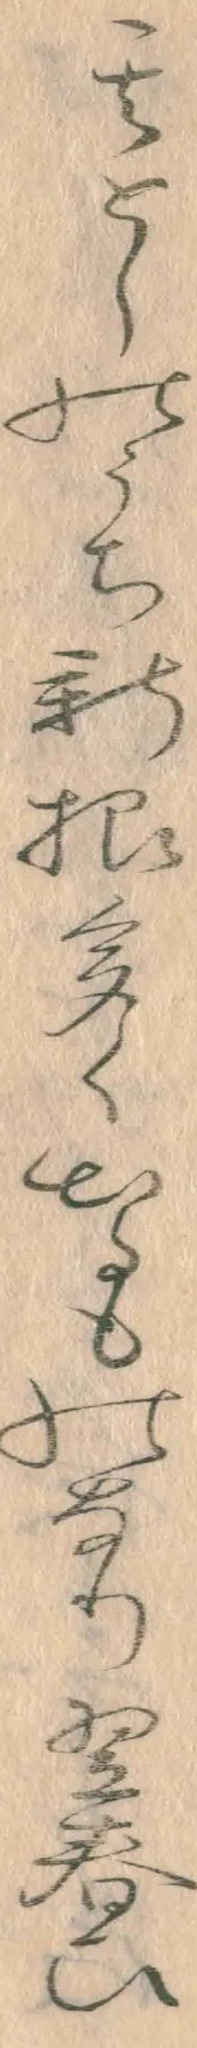其としのうち新根多く出るものなり翌春ひ
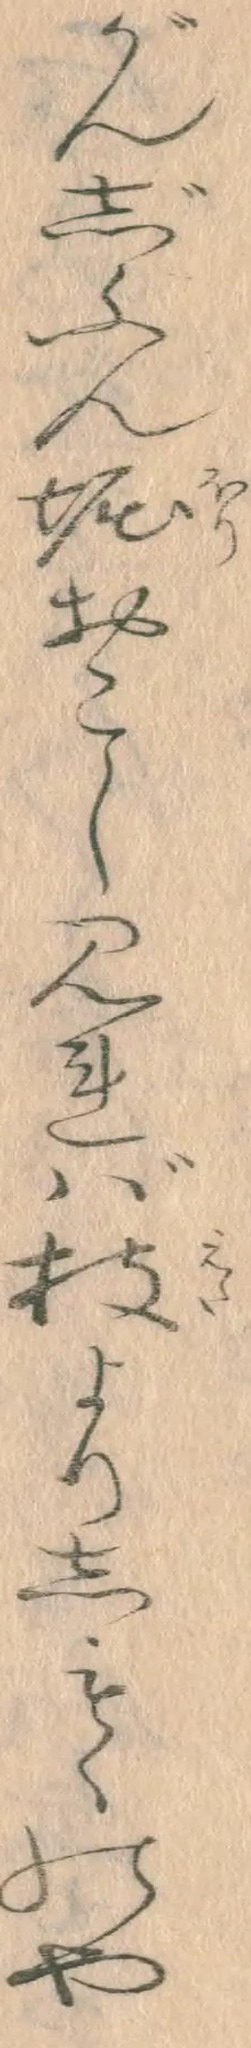がんじふん堀おこし見れば枝よりしもくのや
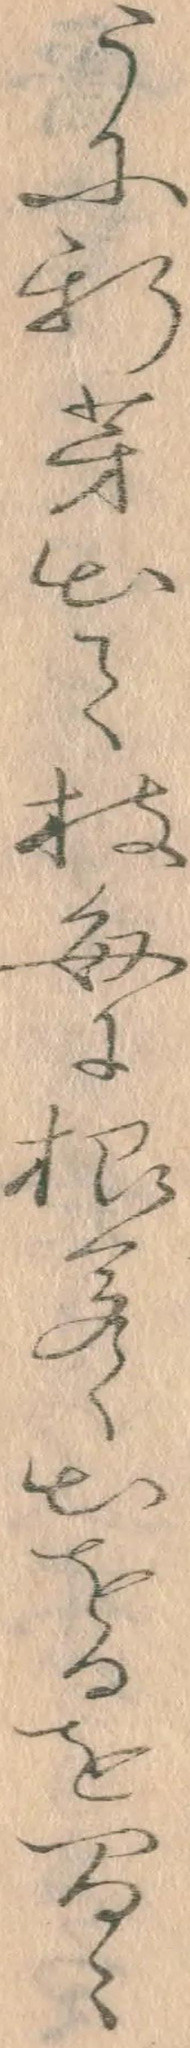うに新芽出て枝毎に根多く出をるを間々
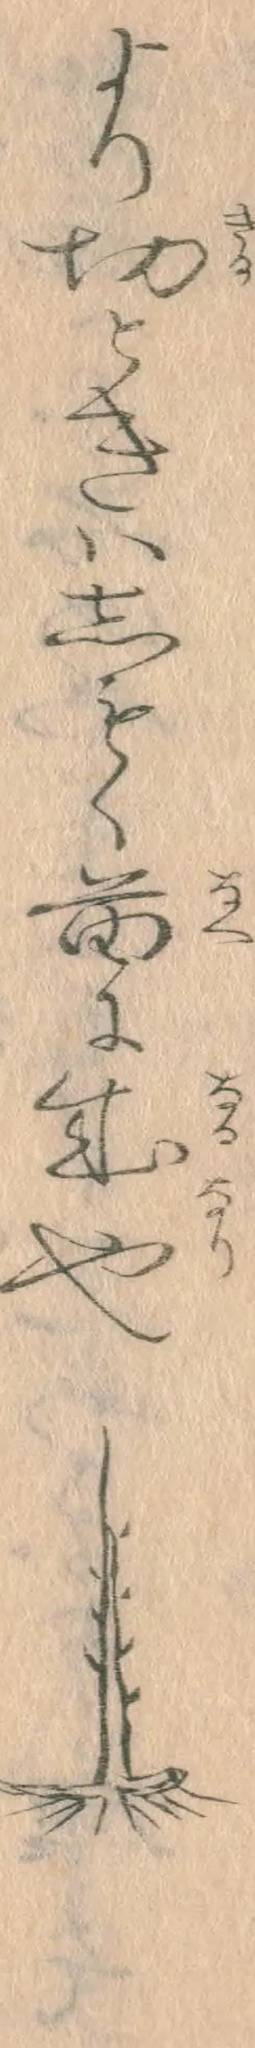より切ときはしもく苗に成也
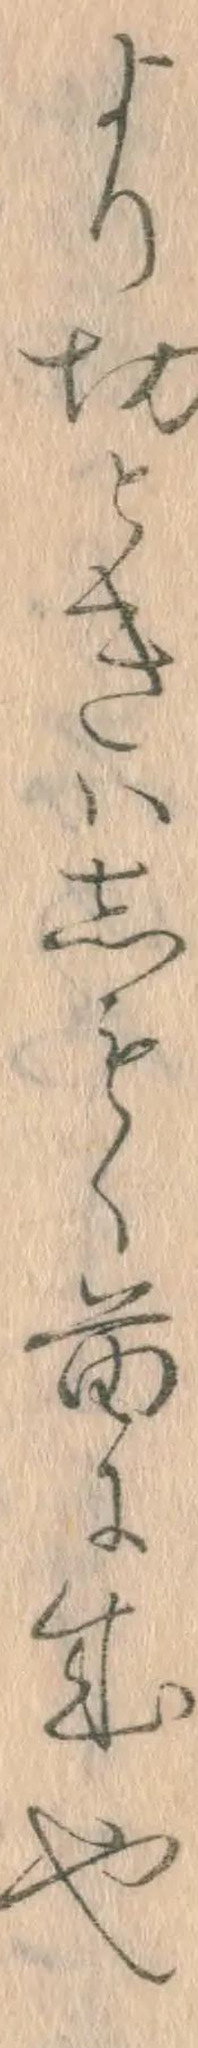より切ときはしもく苗に成也
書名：蚕茶并紙木植方書
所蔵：国立国会図書館 National Diet Library, JAPAN
